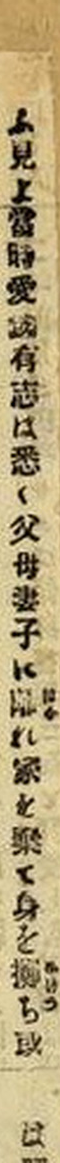ふ見よ当時愛国有志は悉く父母妻子に離れ家を棄て身を擲ち或
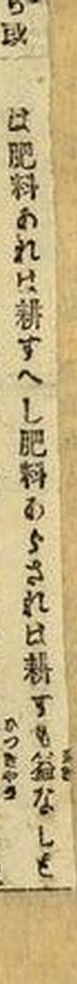は肥料あれは耕すへし肥料あらされは耕すも益なしと
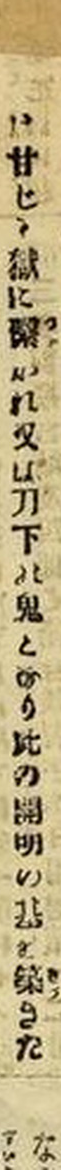は甘じて獄に繋かれ又は刀下の鬼となり此の開明の基を築（きづ
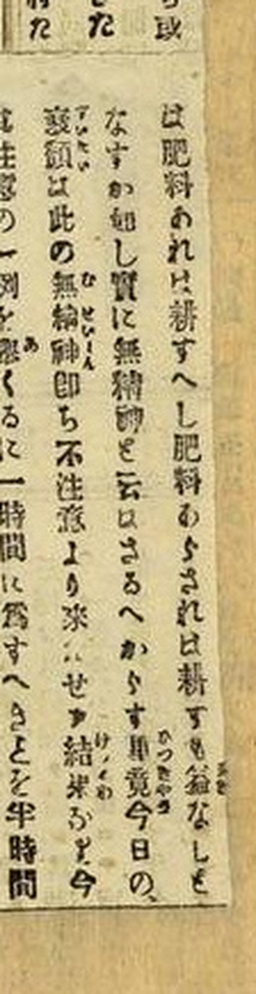なすか如し実に無精神と云はさるへからす畢竟今日の
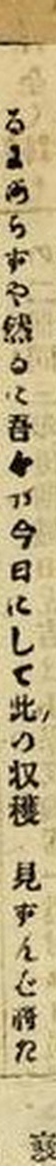るにあらずや然るに吾々か今日にして此の収穫見ずんば将た
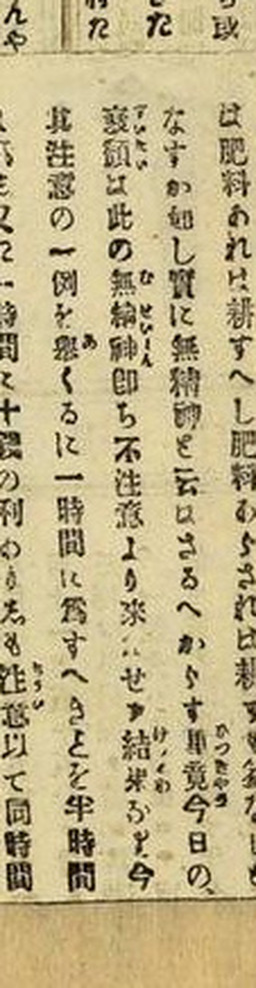衰頽は此の無精神即ち不注意より来せ結果なり今
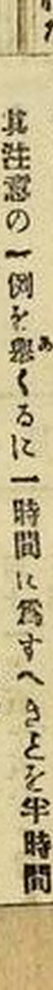其注意の一例を挙くるに一時間に為すへきことを半時間
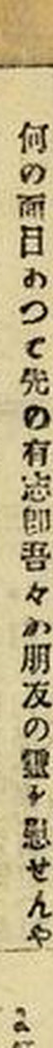何の面目あつて先の有志即吾々か朋友の霊を慰せんや
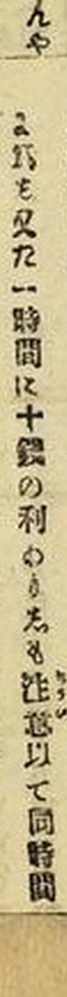に為す又た一時間に十銭の利ありしも注意以て同時間
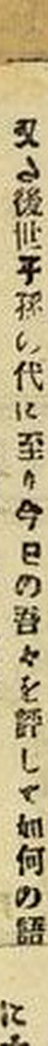又た後世子孫の代に至り今日の吾々を評して如何の語
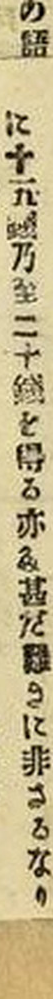に十五銭乃至二十銭を得る亦た甚だ難きに非さるなり
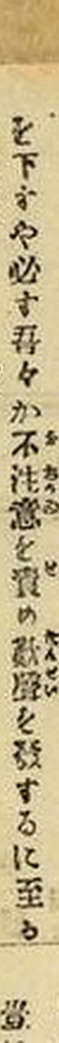を下すや必す吾々か不注意を責め歎声を発するに至る
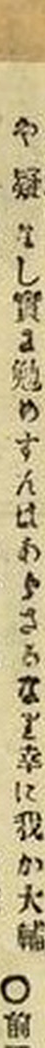や疑なし実に勉めすんはあらさるなり幸に我か大輔
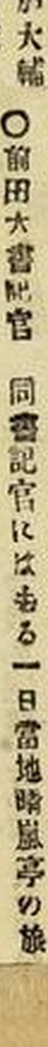〇前田大書記官同書記官には去る一日当地晴嵐亭の旅
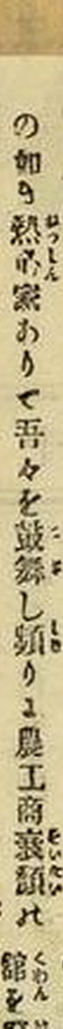の如き熱心党ありて吾々を鼓舞し頻りに農工商衰頽の
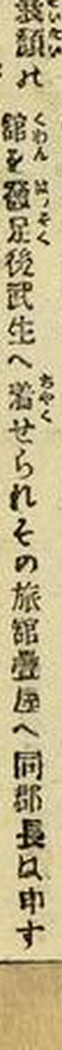館を発足後武生へ着せられその旅館畳屋へ同郡長は申す
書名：温古集 五巻
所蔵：福井県文書館 Fukui Prefectural Archives
